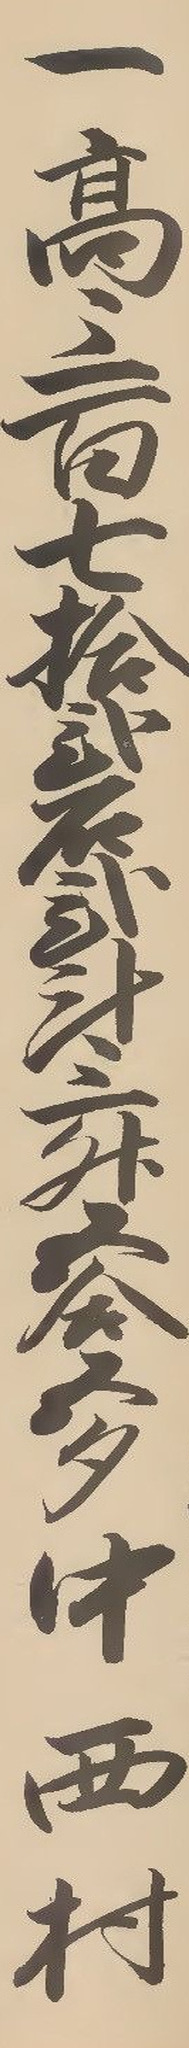一高百七拾四石弐斗五升三合五勺越佐村
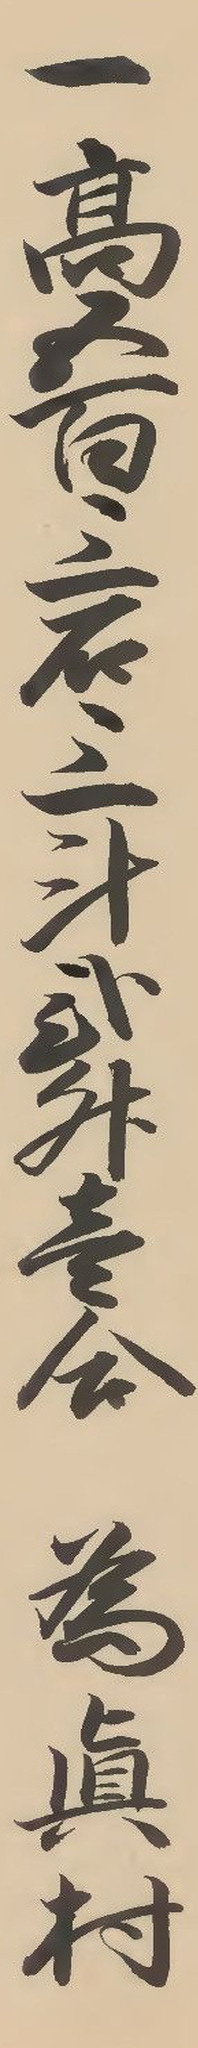一高五百三石三斗弐升壱合為真村
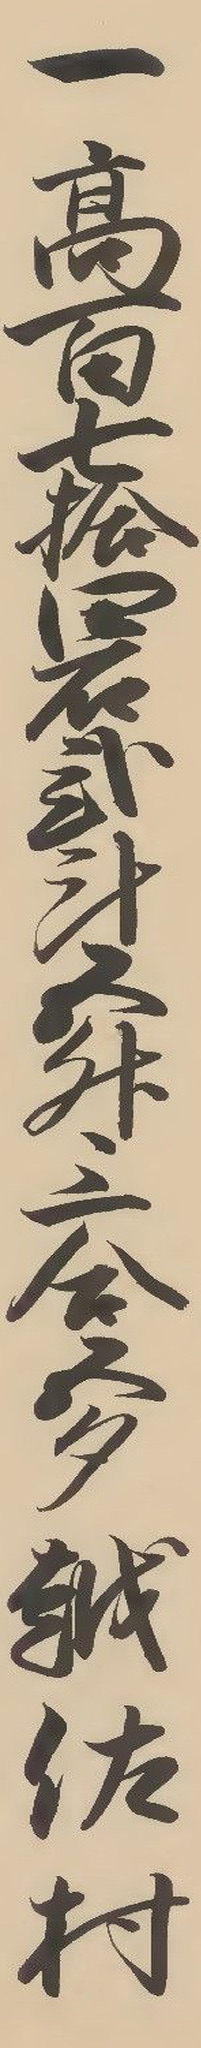一高百七拾四石弐斗五升三合五勺越佐村
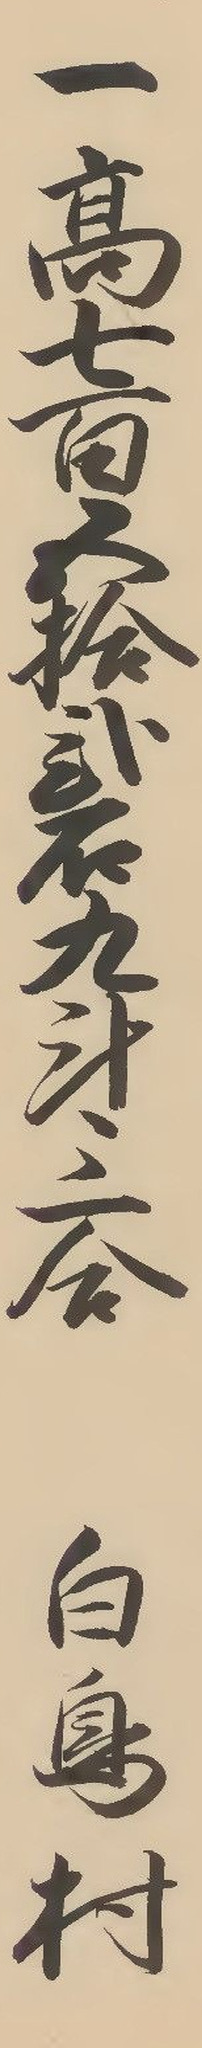一高七百五拾弐石九斗三合白鳥村

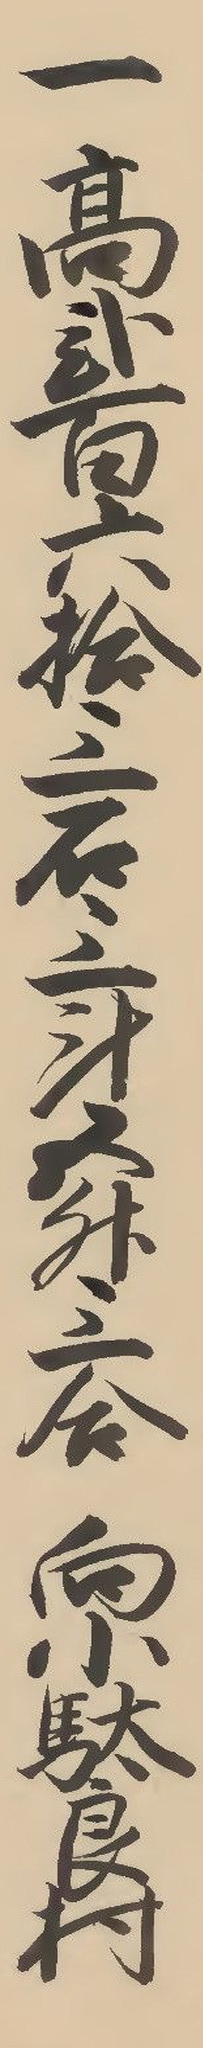一高弐百六拾三石三斗五升三合向小駄良村
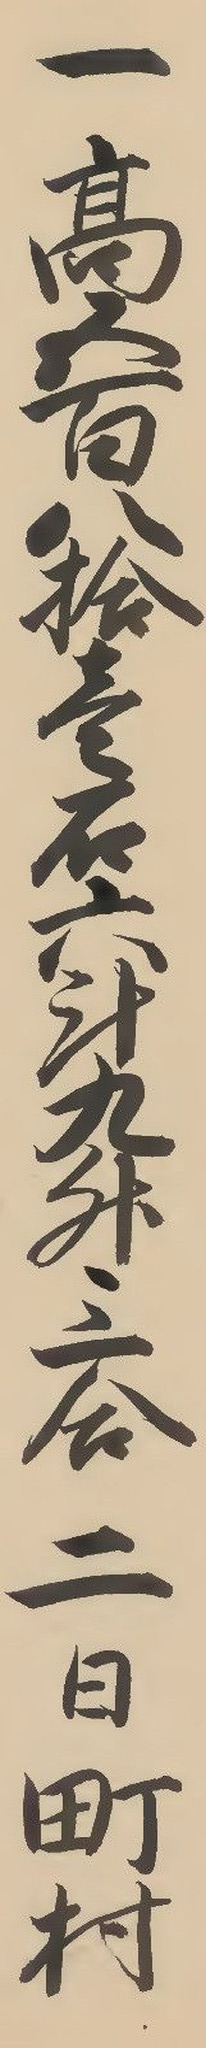一高五百八拾壱石六斗九升三合二日町村
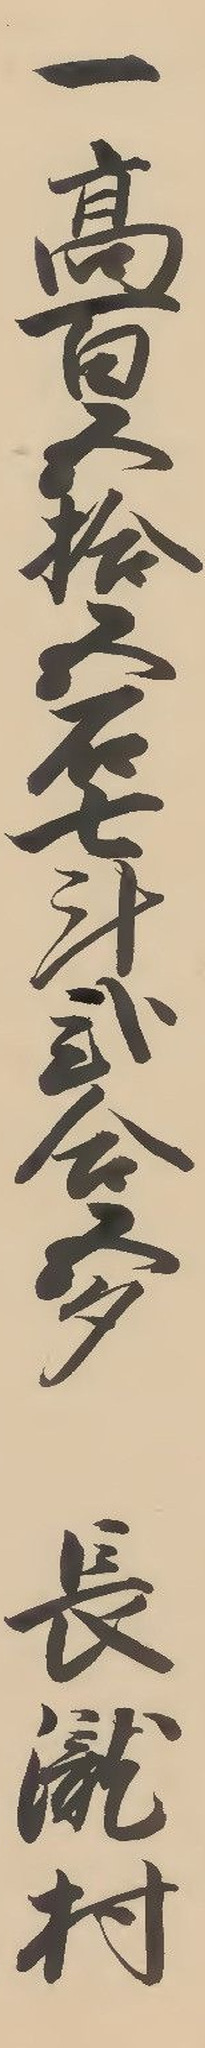一高百五拾五石七斗弐合五勺長滝村
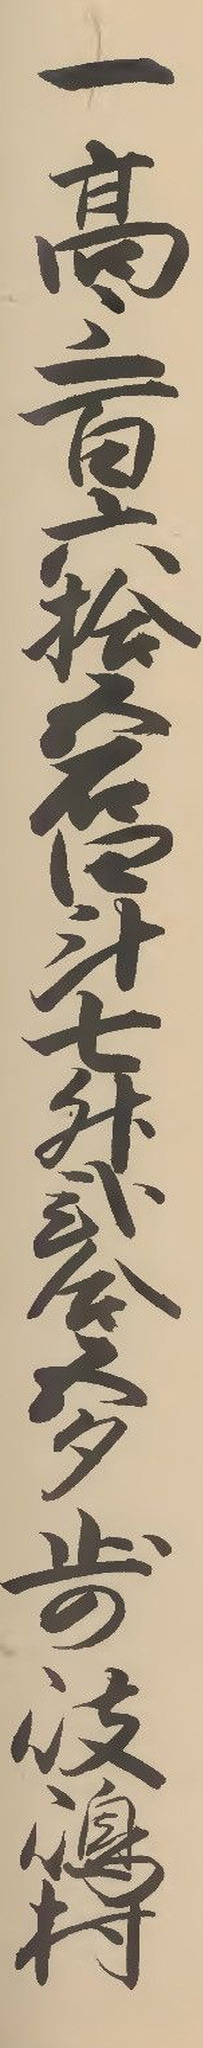一高三百六拾五石四斗七升弐合五勺歩岐島村
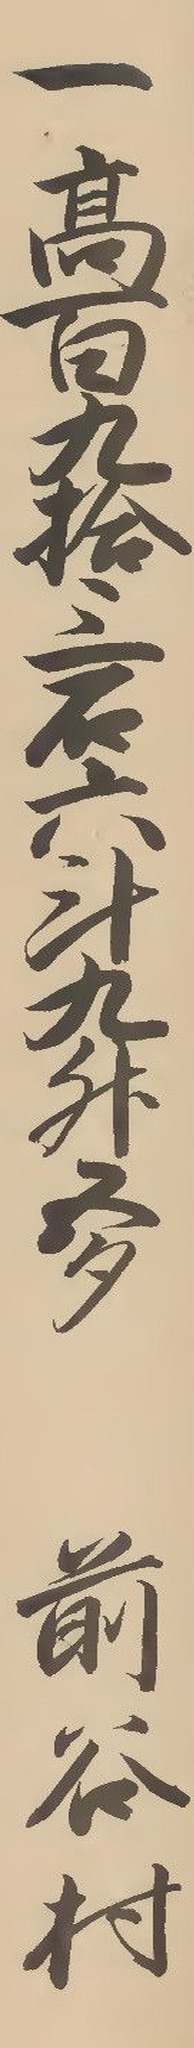一高百九拾三石六斗九升五勺前谷村
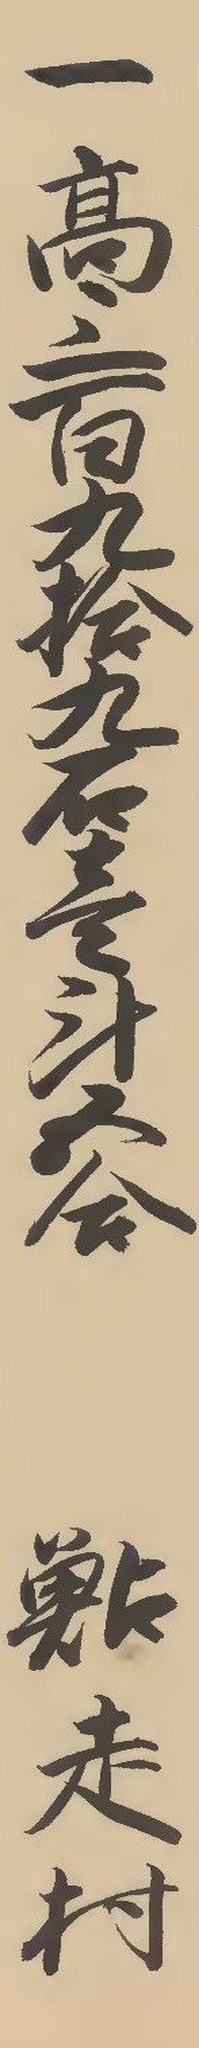一高三百九拾九石壱斗五合鮎走村
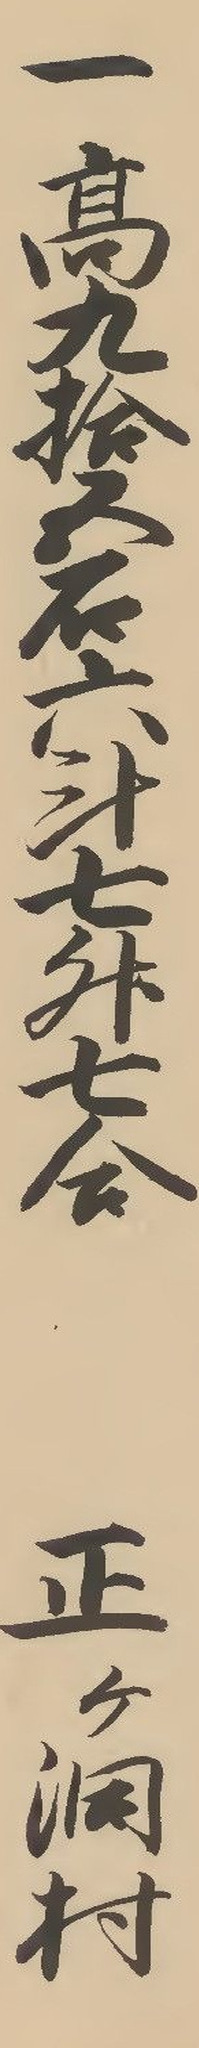一高九拾五石六斗七升七合正ヶ洞村
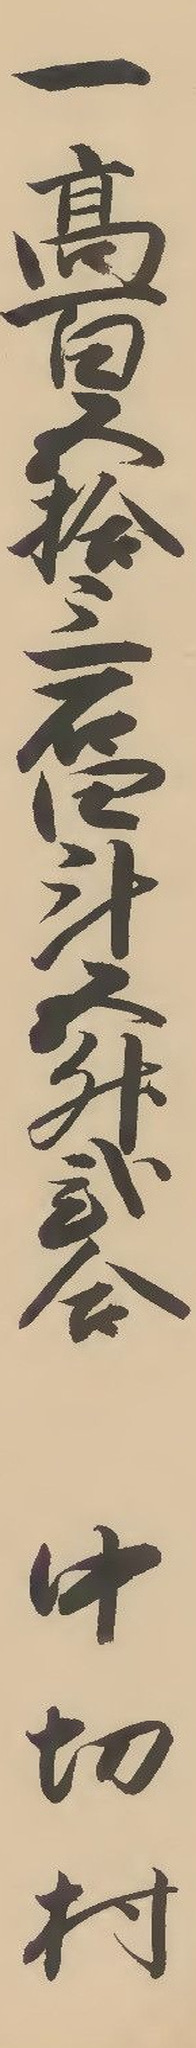一高百五拾三石四斗五升弐合中切村

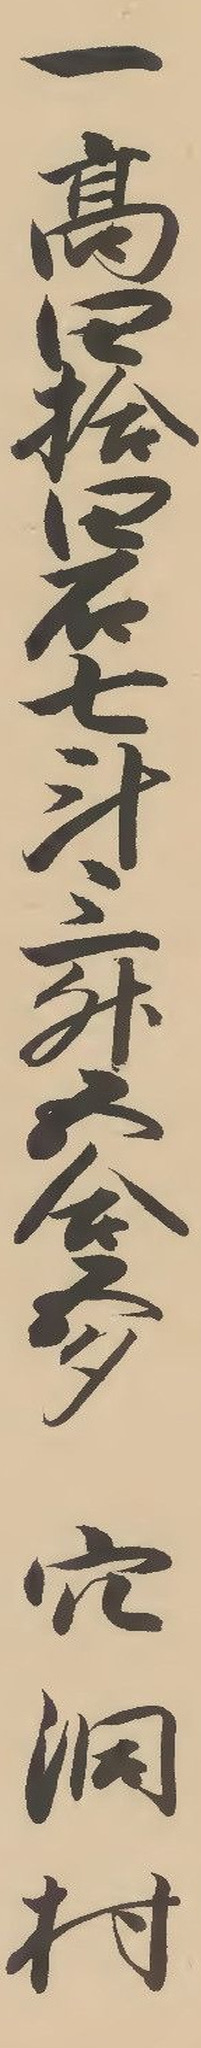一高四拾四石七斗三升五合五勺穴洞村
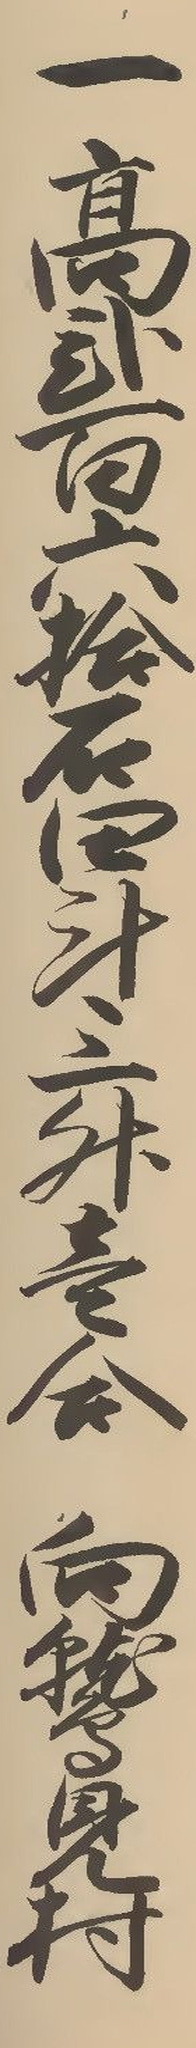一高弐百六拾石四斗三升壱合向鷲見村
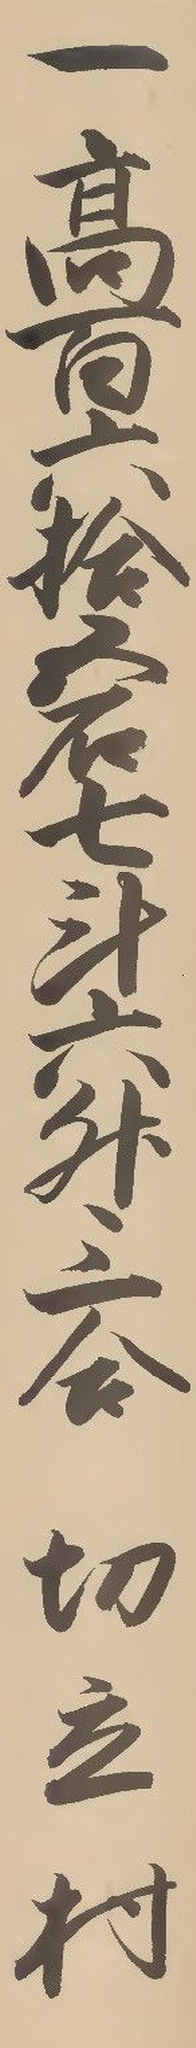一高百六拾五石七斗六升三合切立村
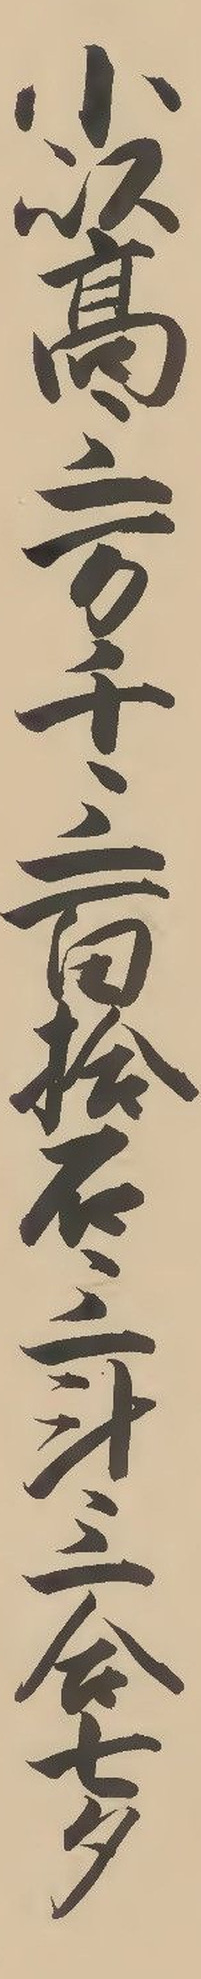小以高三万千三百拾石三斗三合七勺
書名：美濃国郷帳
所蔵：国立公文書館 National Archives of Japan
